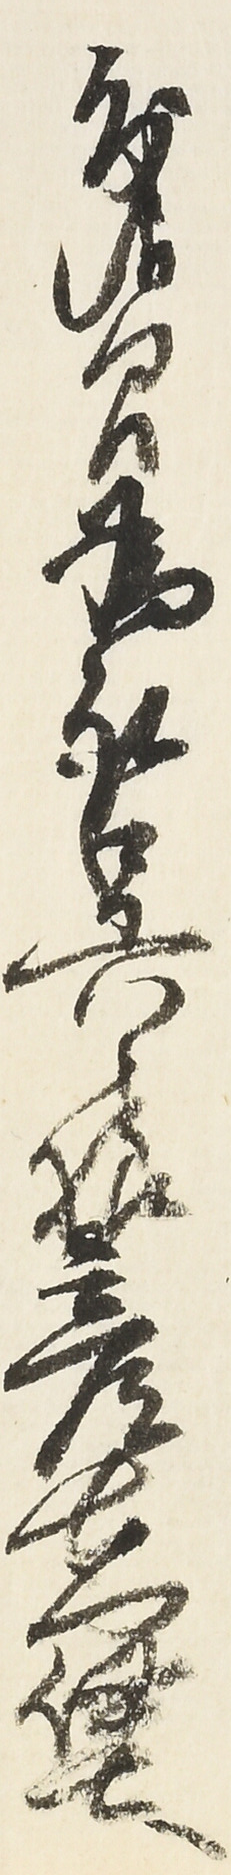度候間為取呉候様彦右衛門伊七へ
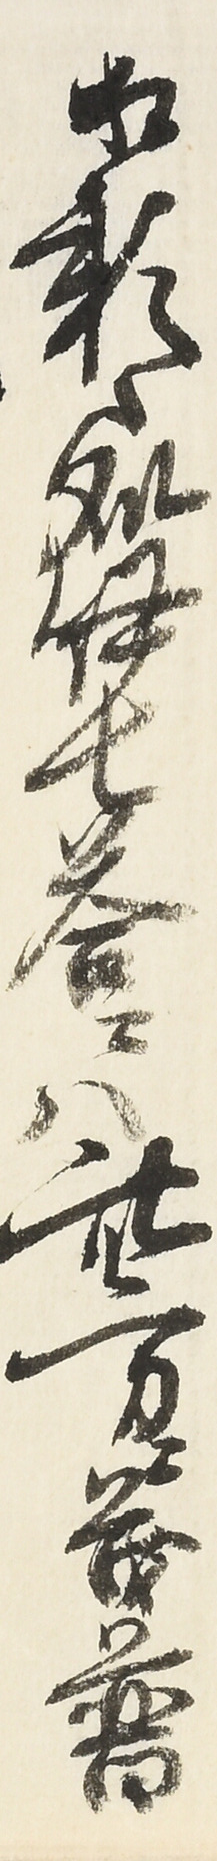相頼候処伊七答ニハ此方ニ茂普
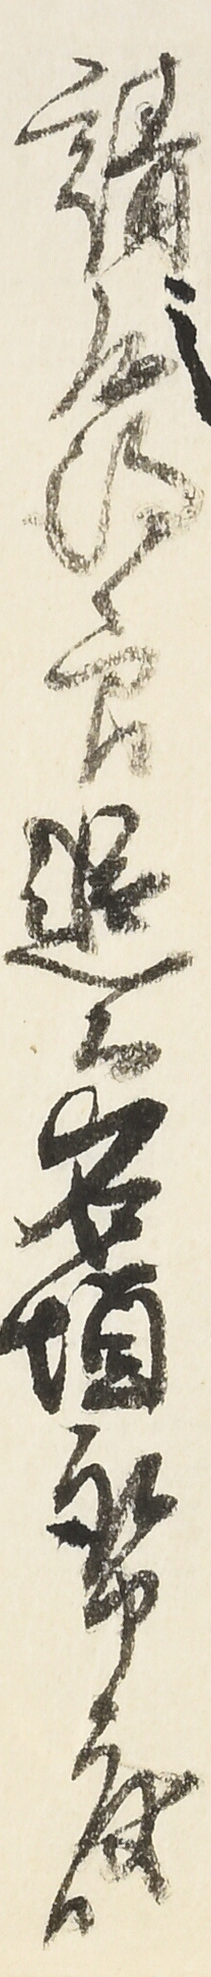請之心得候間追而石垣取申度候
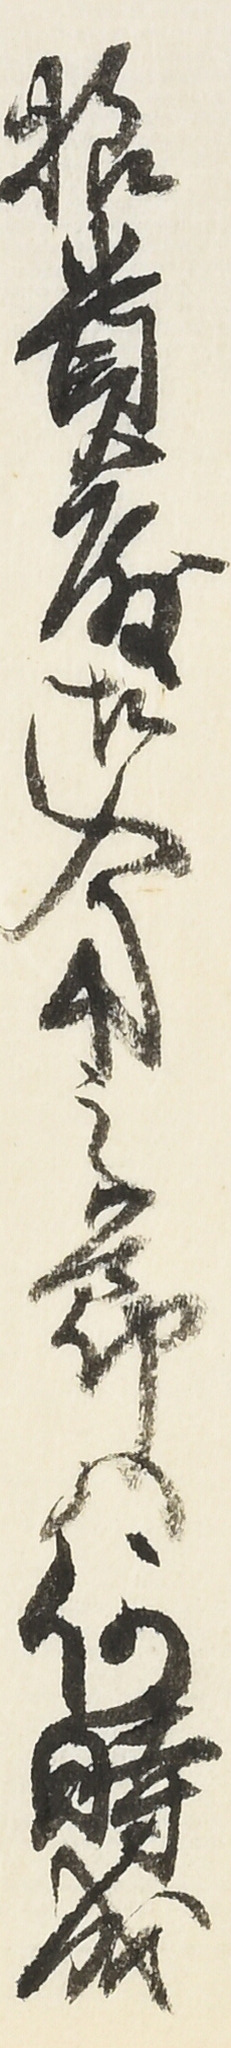様貴殿御入用之節ハ何時成
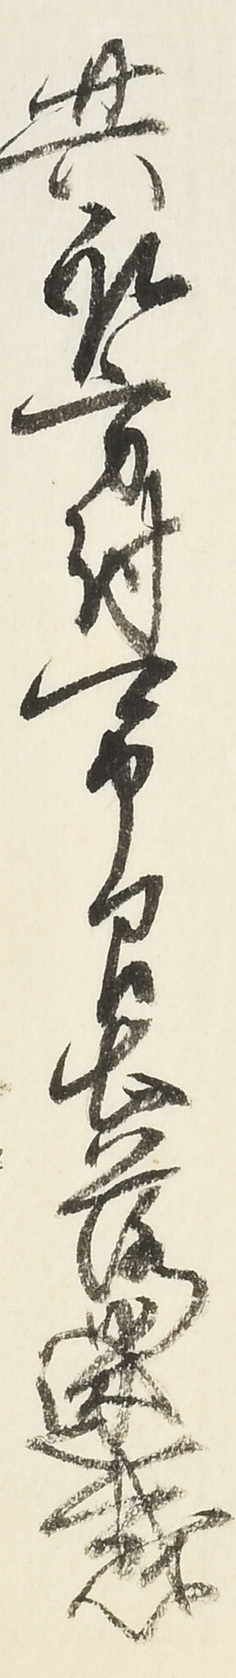共取方付可申間土落迷惑
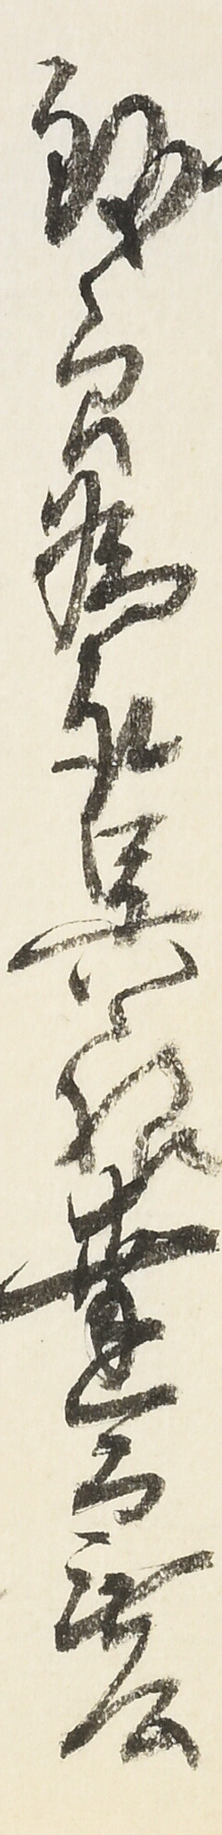致候間為取呉候様達而無心
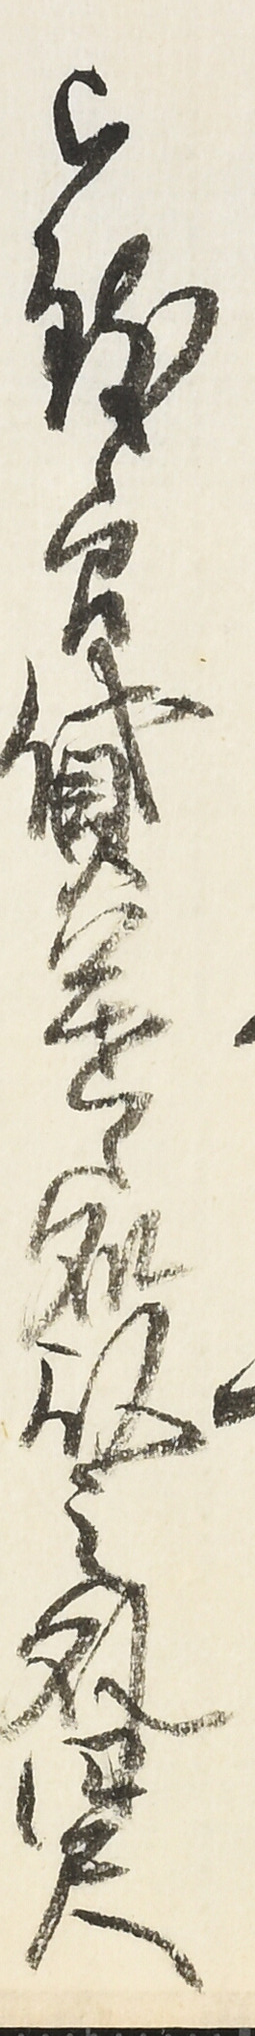被致候間貸遣候処以之外四尺
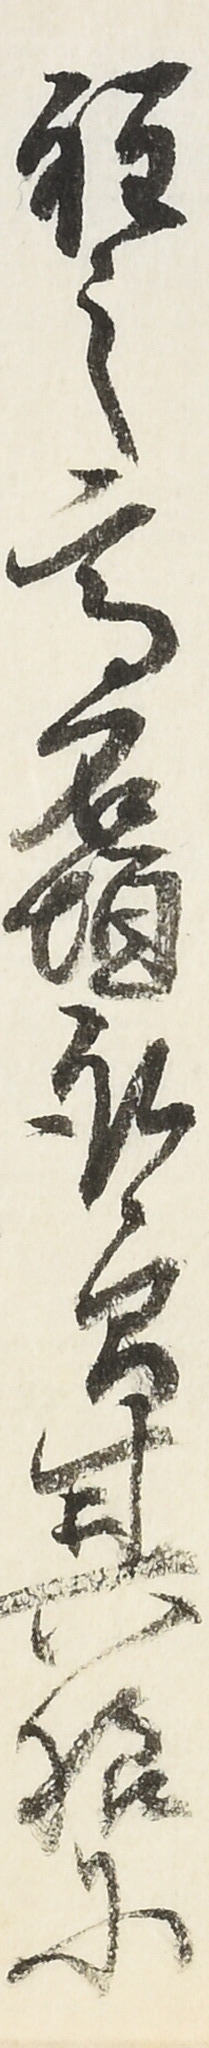程之高石垣取候間其様に
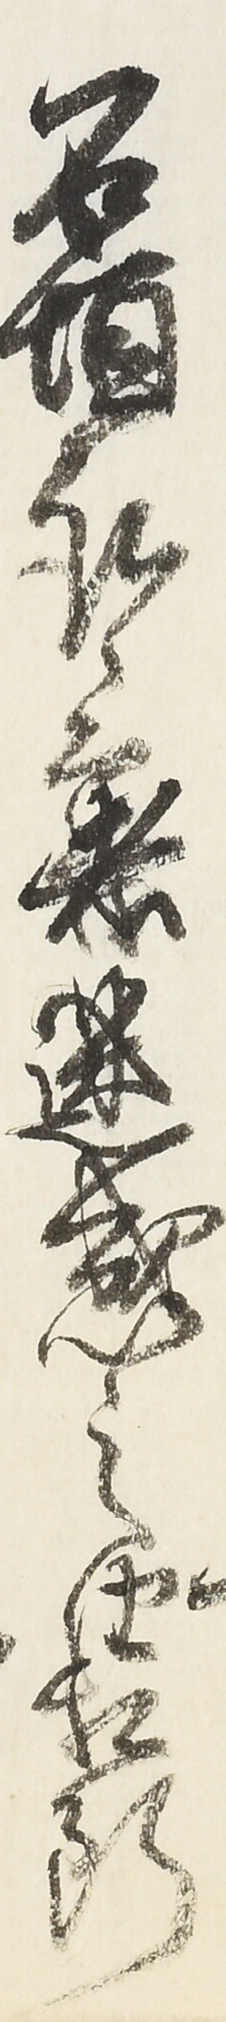石垣取候而者迷惑之由相断
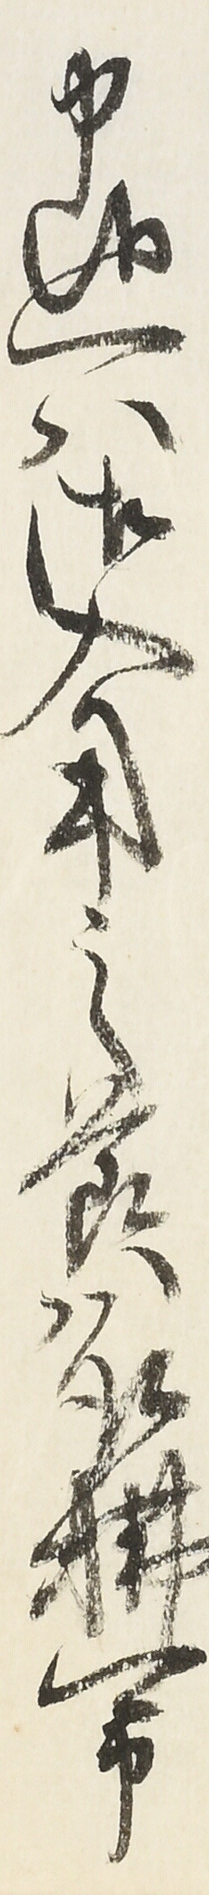申候へハ御入用之節ハ取払可申

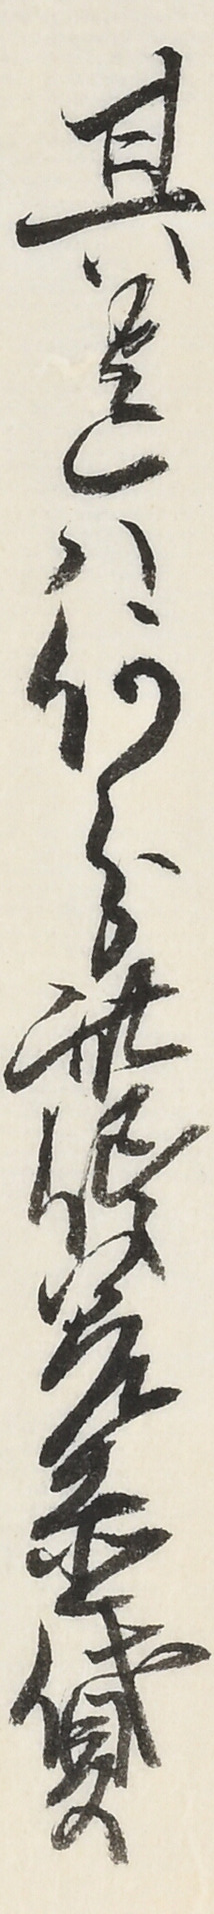其迄ハ何分此侭差置貸
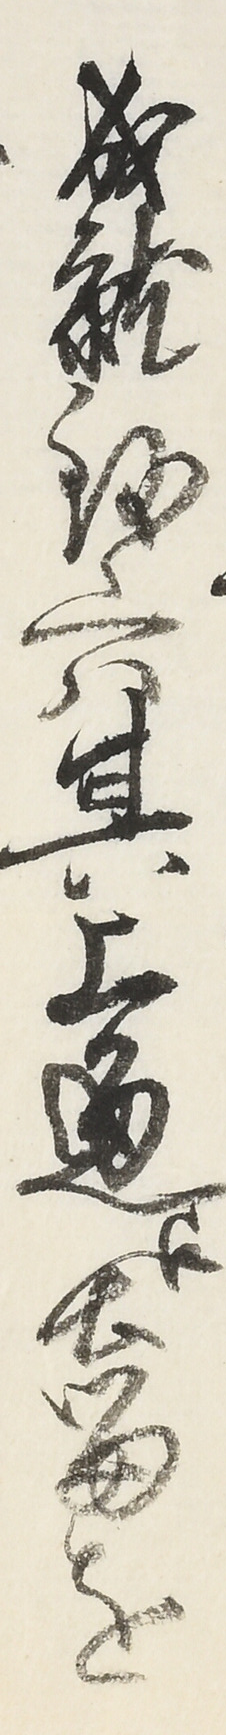成就致候へハ其上通江土留を
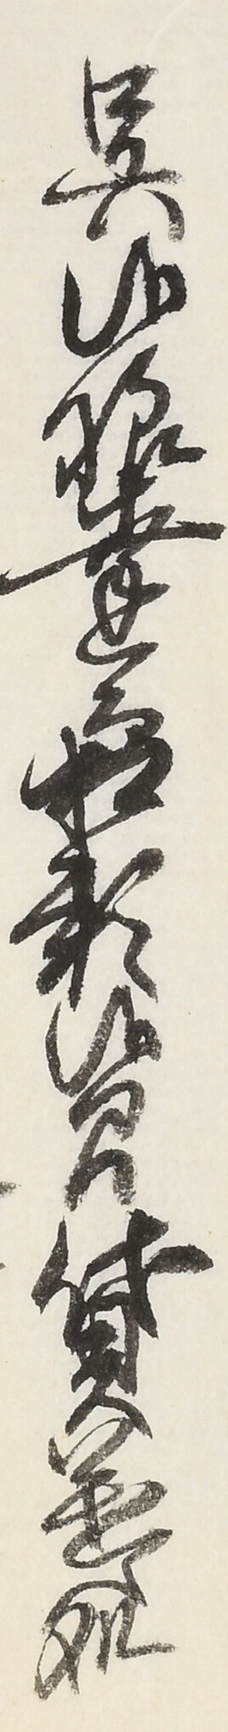呉候様達而相頼候間貸遣候処
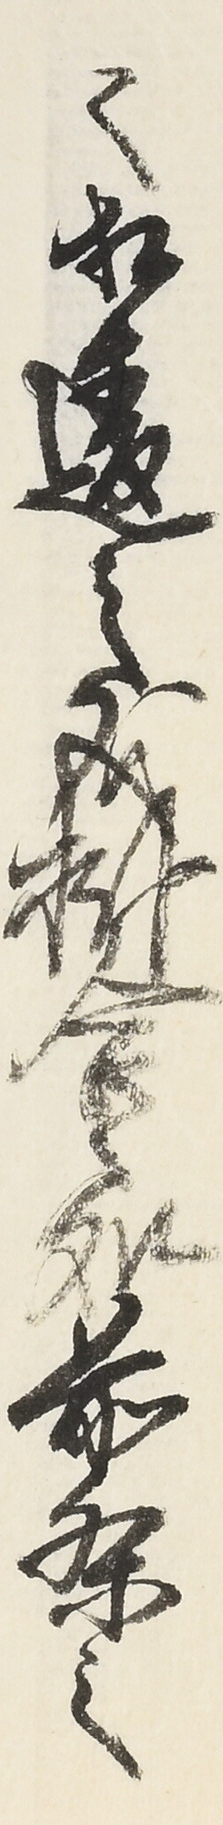々相違之義掛合候処前草条之
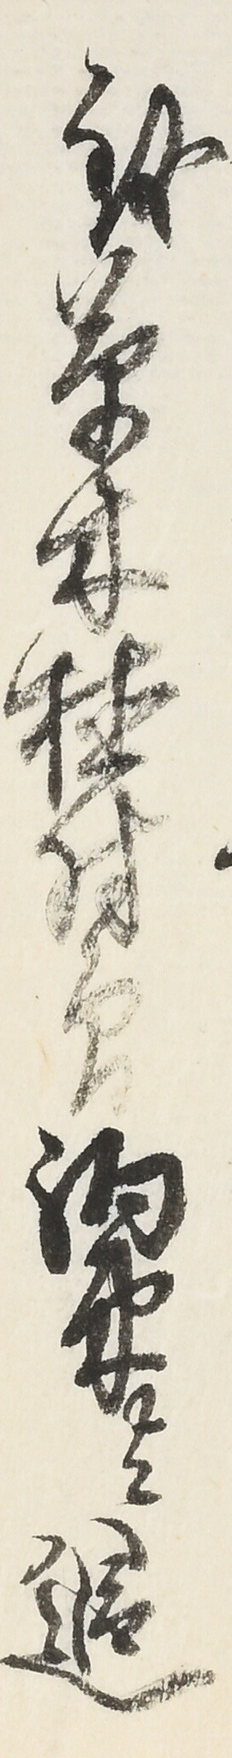致草木植付候間約束とハ追
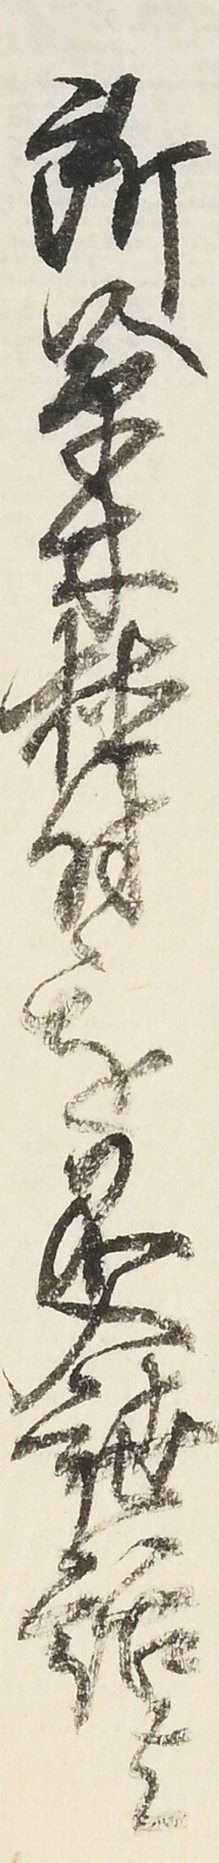所へ草木植付候を不入世話与
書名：乍恐御内々子委奉申上度口上書
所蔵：伊那市立高遠町図書館・合同会社AMANE
